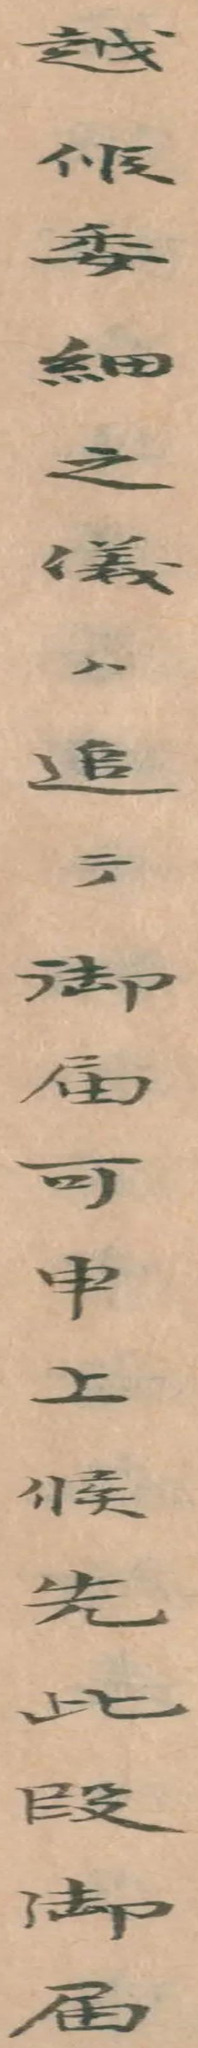越候委細之儀ハ追テ御届可申上候先此段御届
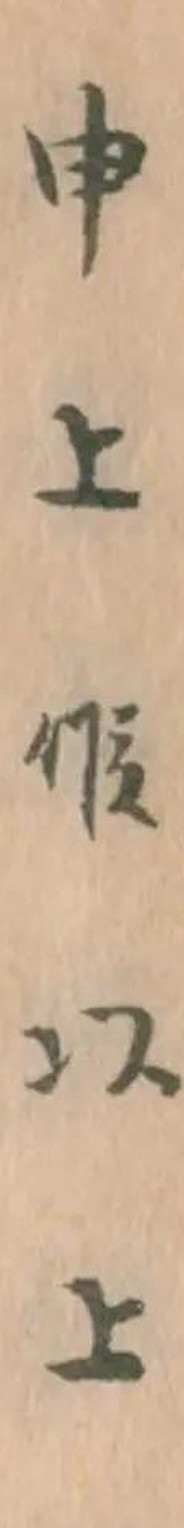申上候以上
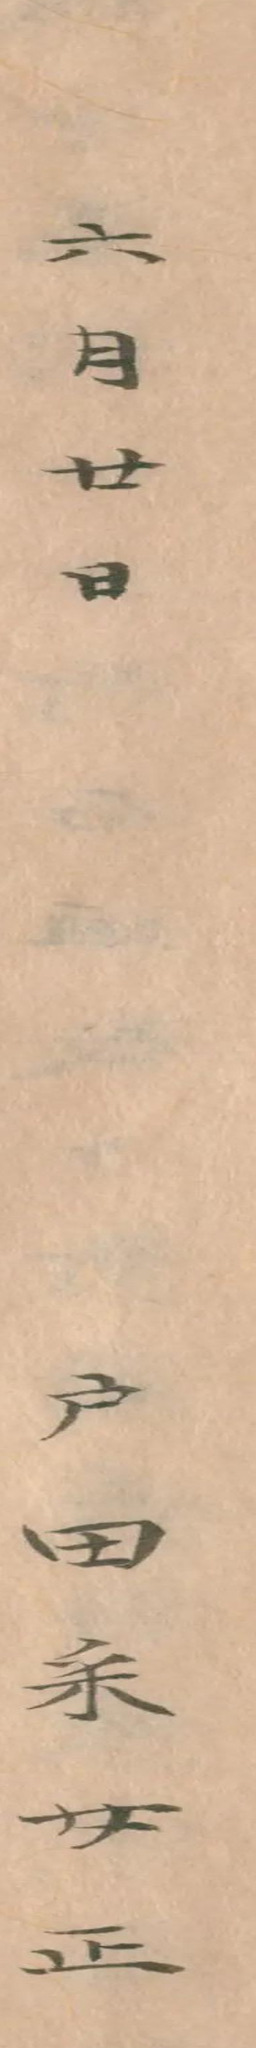六月廿日戸田采女正
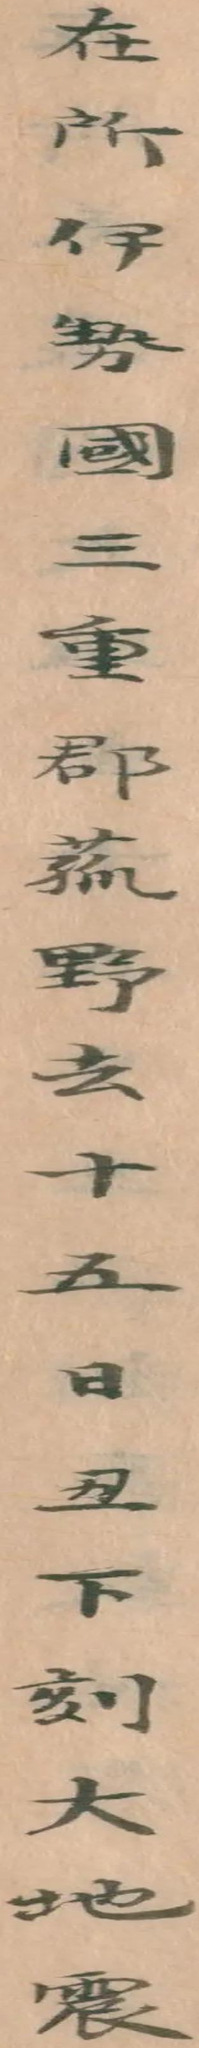在所伊勢国三重郡菰野去十五日丑下刻大地震
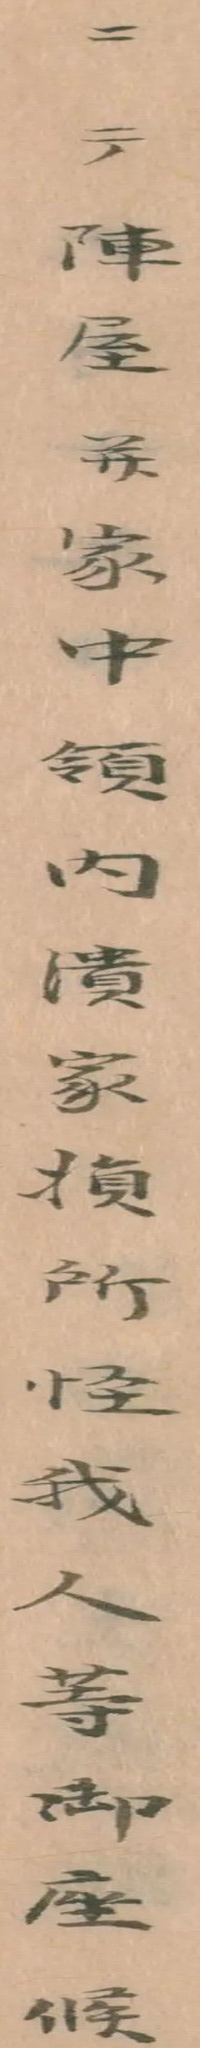ニテ陣屋并家中領内潰家損所怪我人等御座候
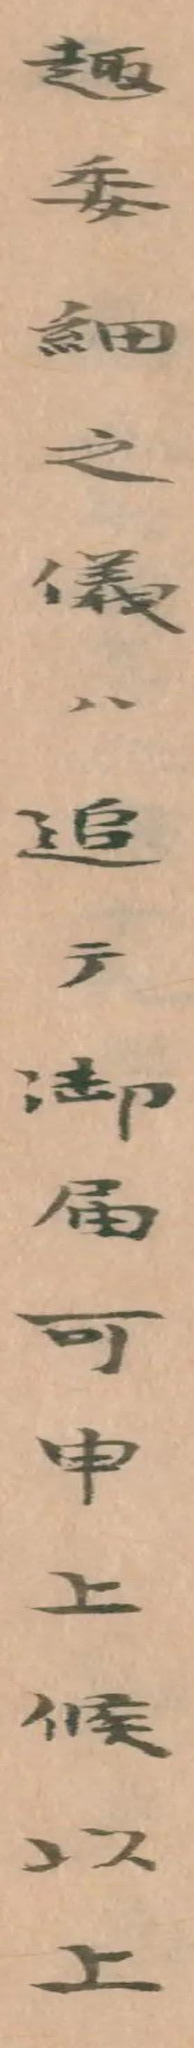趣委細之儀ハ追テ御届可申上候以上
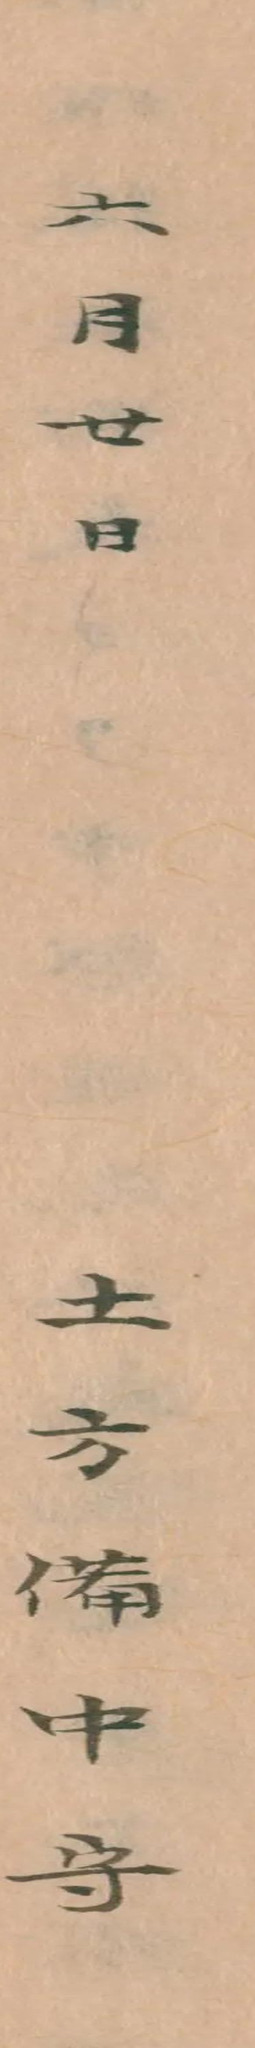六月廿日土方備中守
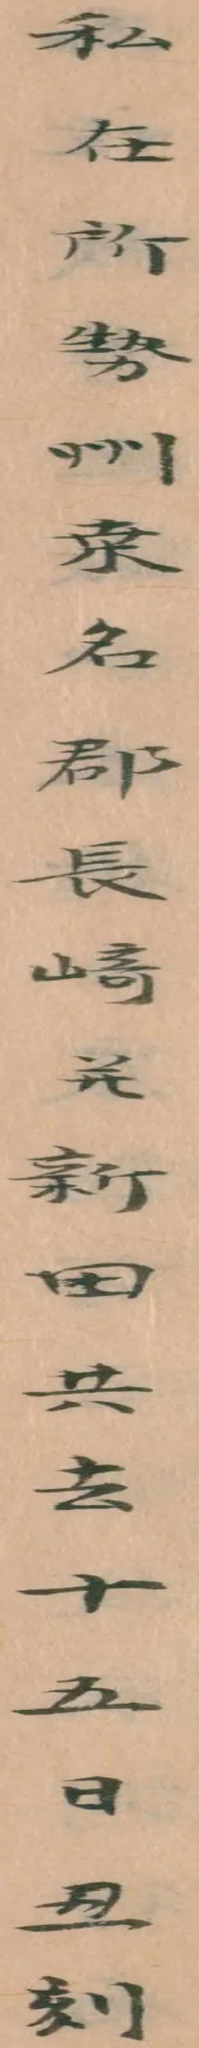私在所勢州桑名郡長崎并新田共去十五日丑刻
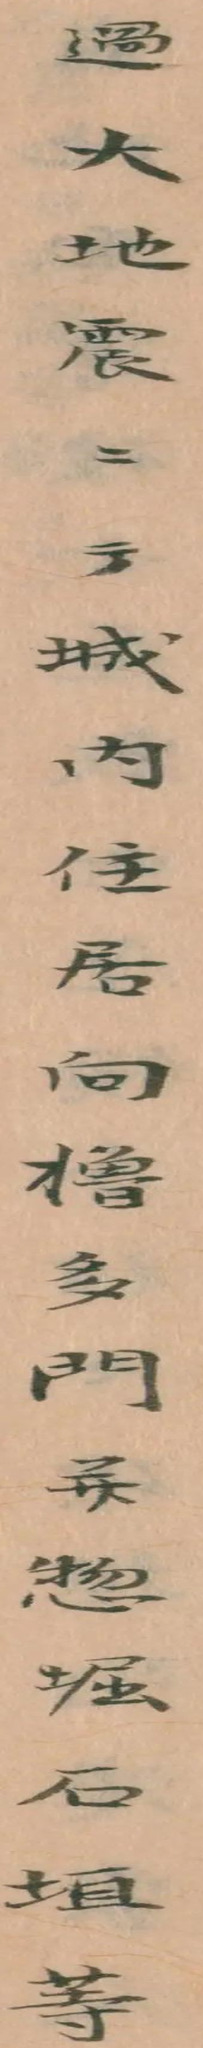過大地震ニテ城内住居向櫓多門并惣堀石垣等
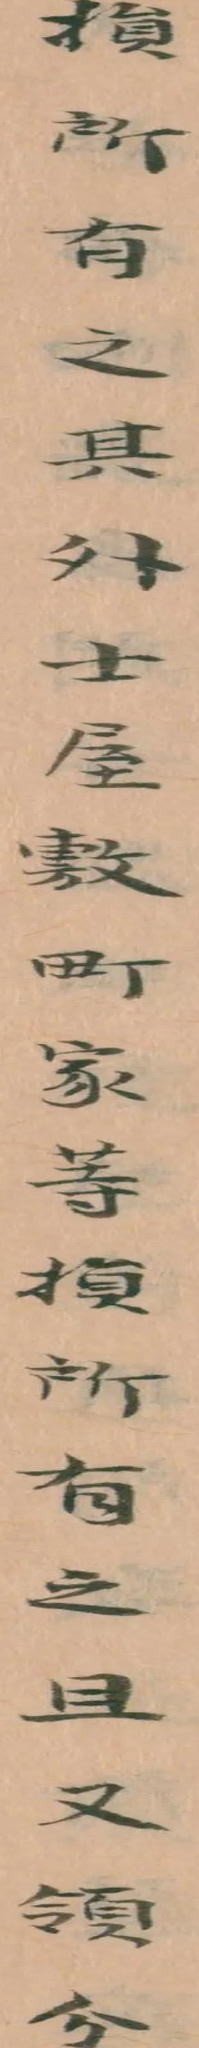損所有之其外士屋敷町家等損所有之且又領分
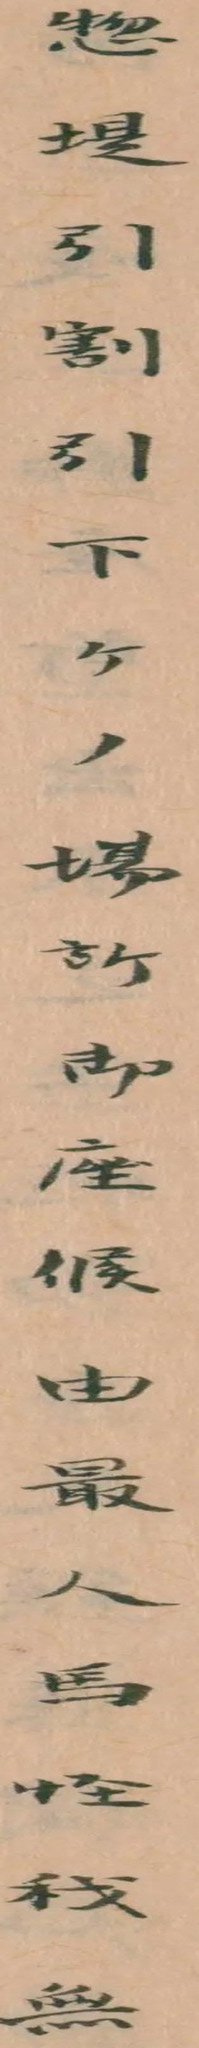総堤引割引下ヶノ場所御座候由最人馬怪我無
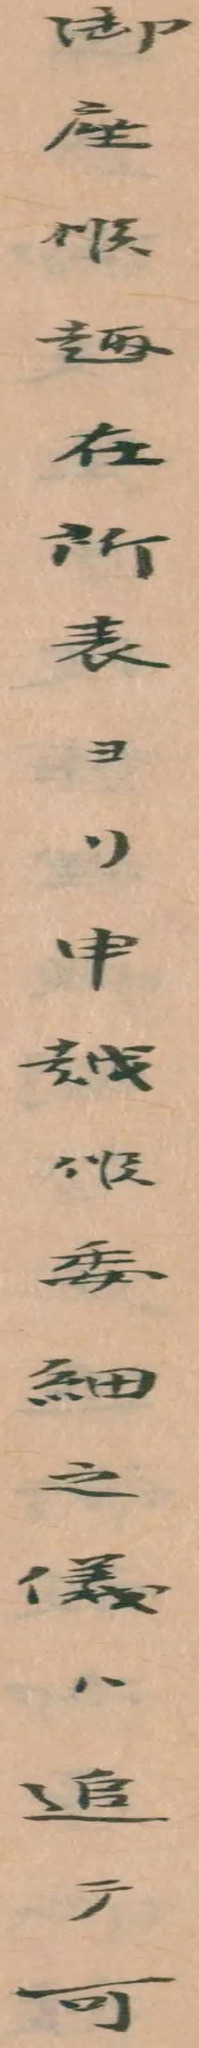御座候趣在所表ヨリ震越候委細之儀ハ追テ可
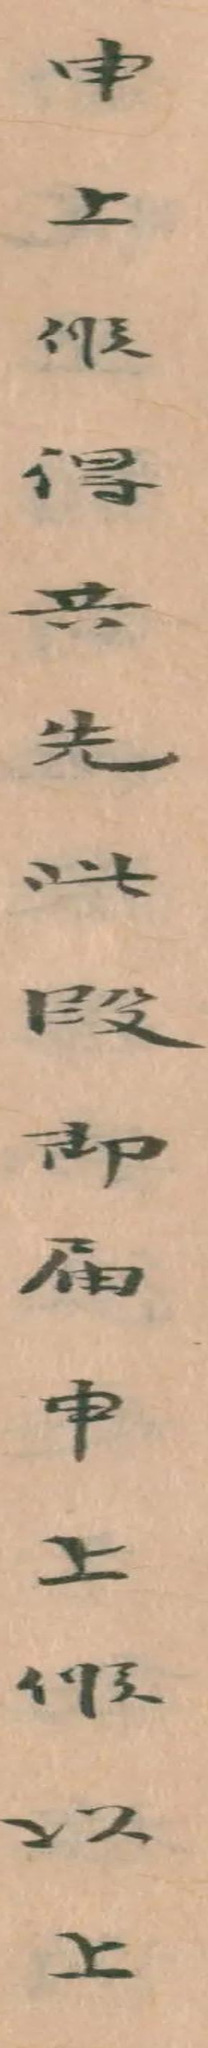申上候得共先此段御届申上候以上
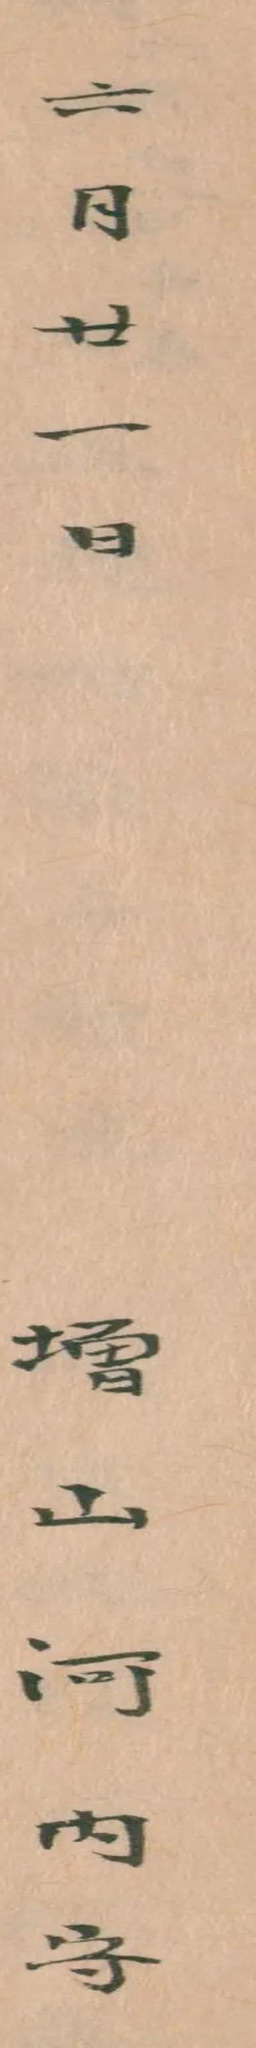六月廿一日増山河内守
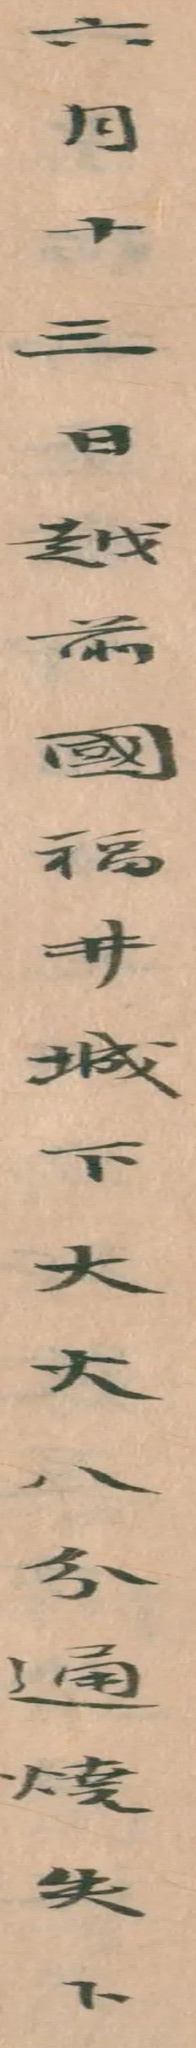六月十三日越前国福井城下大火八分通焼失ト
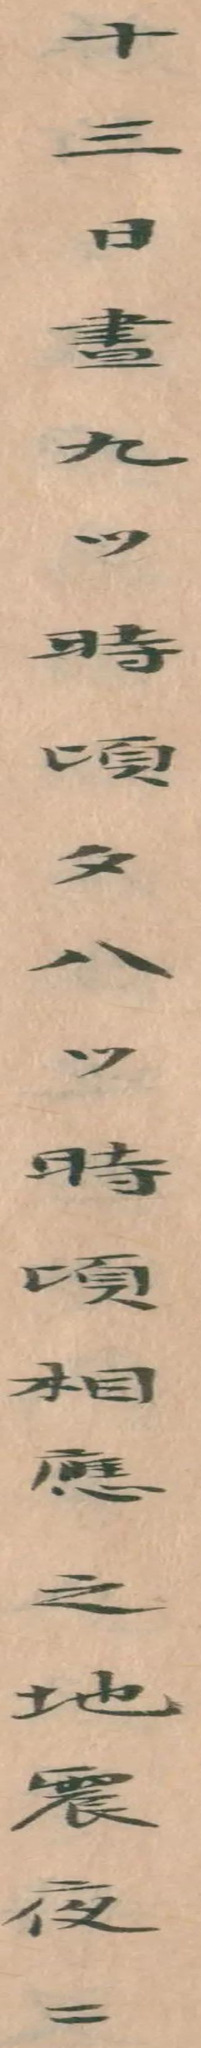十三日晝九ッ時頃夕八ッ時頃相応之地震夜二
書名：地災撮要. 巻1(噴火山・地震ノ部)
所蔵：国立国会図書館 National Diet Library, JAPAN
